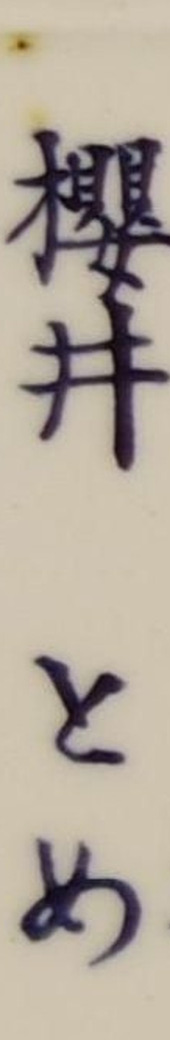桜井とめ
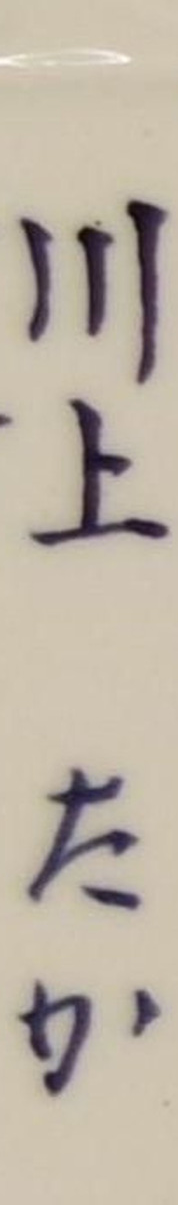川上たか
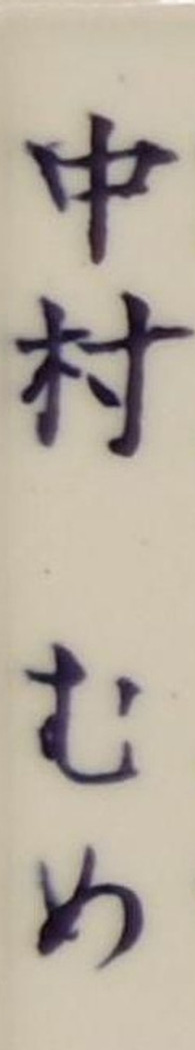中村むめ

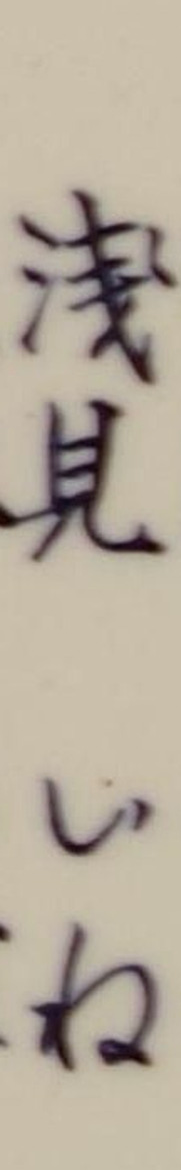浅見いね
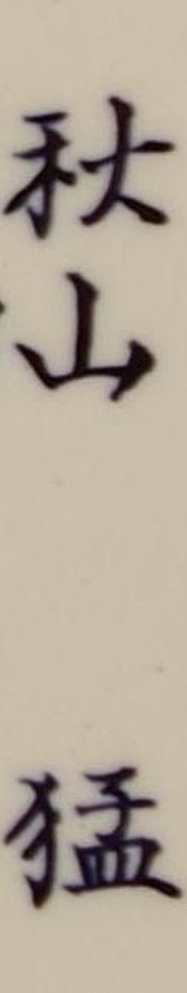秋山猛
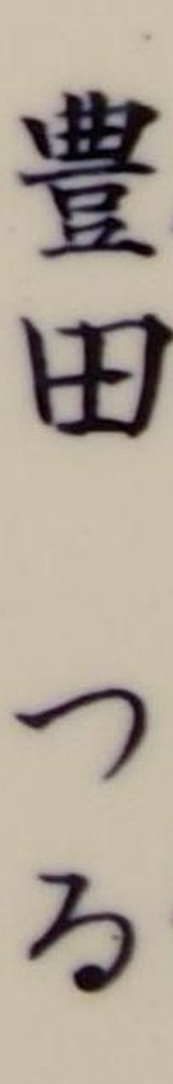豊田つる
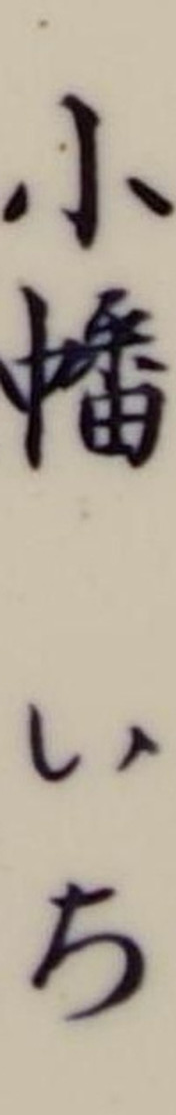小幡いち
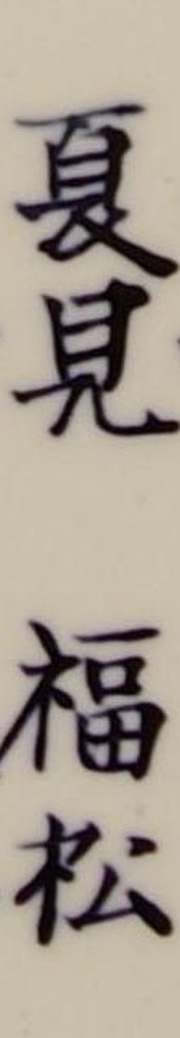夏見福松
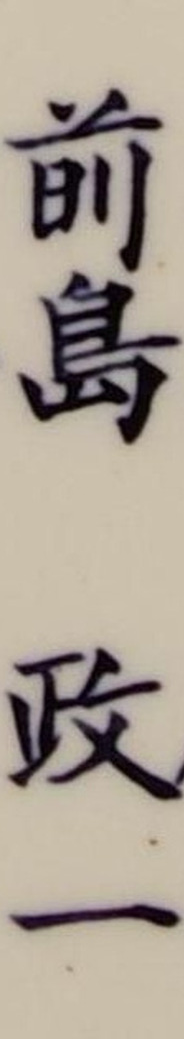前島政一
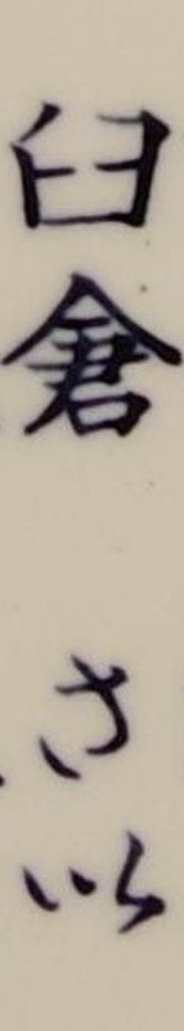臼倉さい
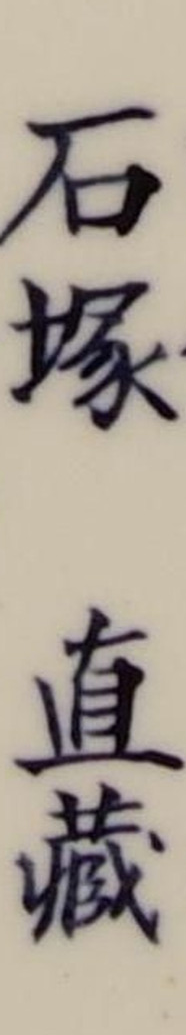石塚直蔵
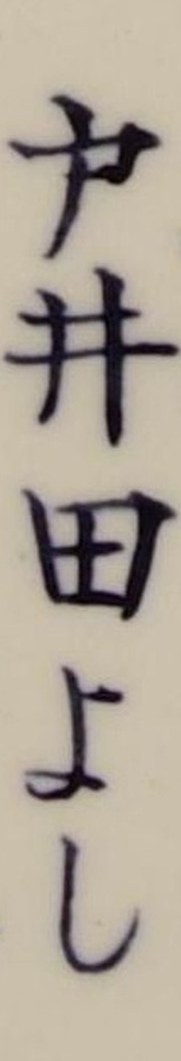戸井田よし
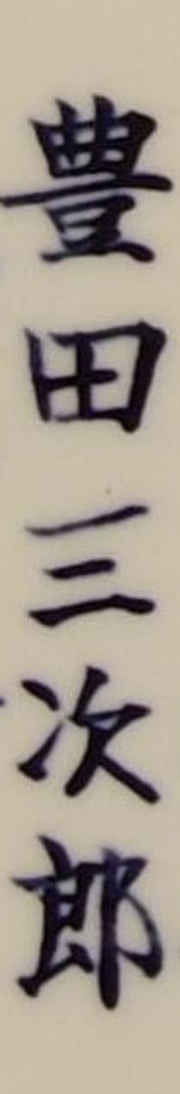豊田三次郎
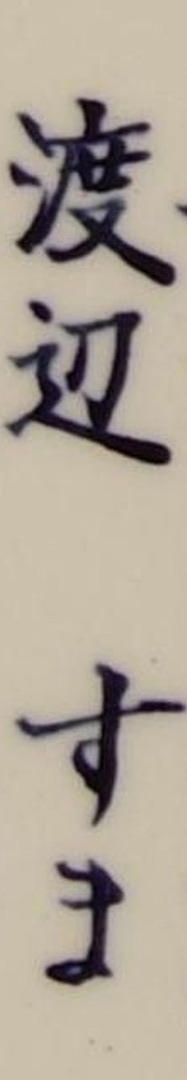渡辺すま
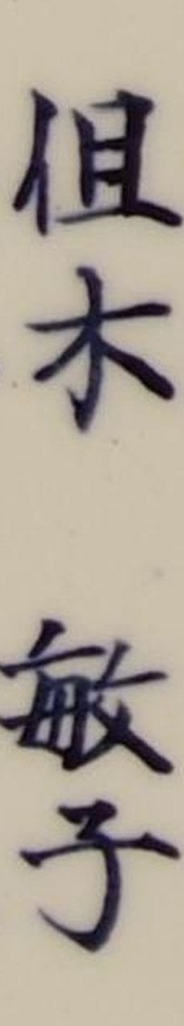但木敏子
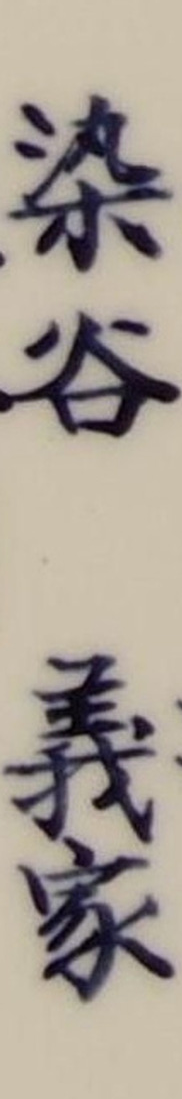染谷義家
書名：M~S
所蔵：高野山金剛峯寺
